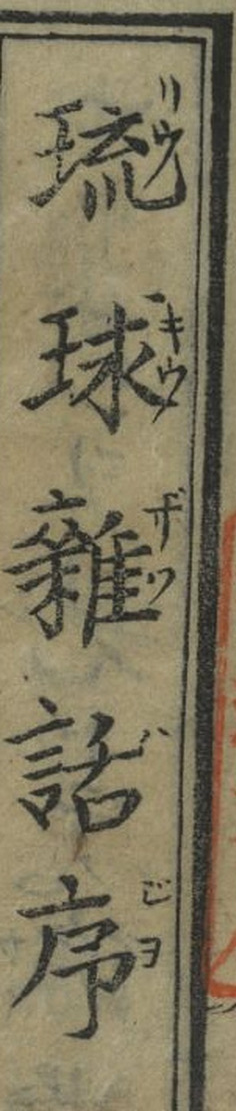琉球雑話序
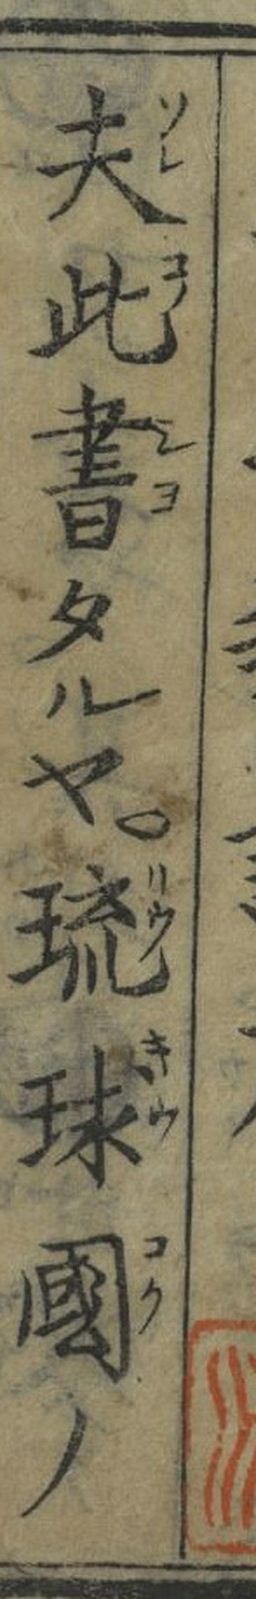夫此書タルヤ。琉球国ノ
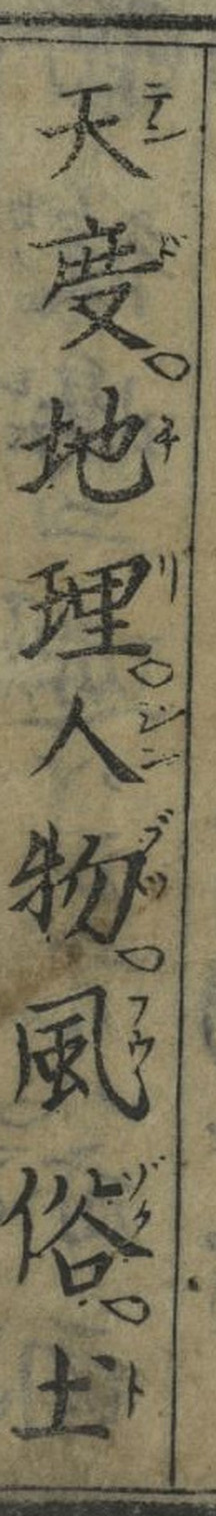天度。地理。人物。風俗。土
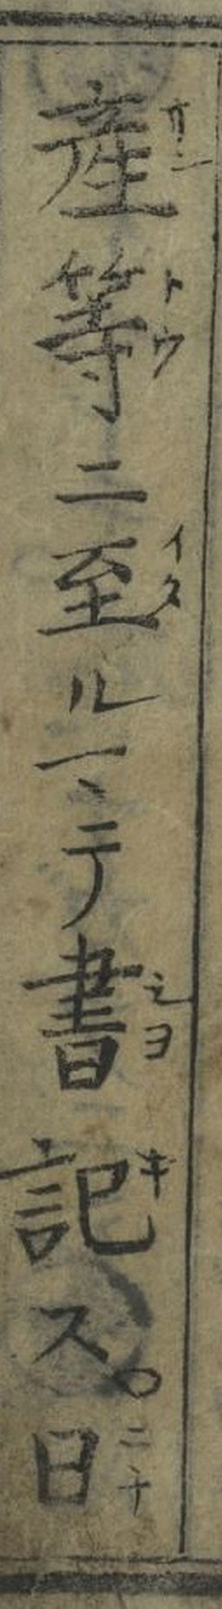産等ニ至ルマテ書記ス。日
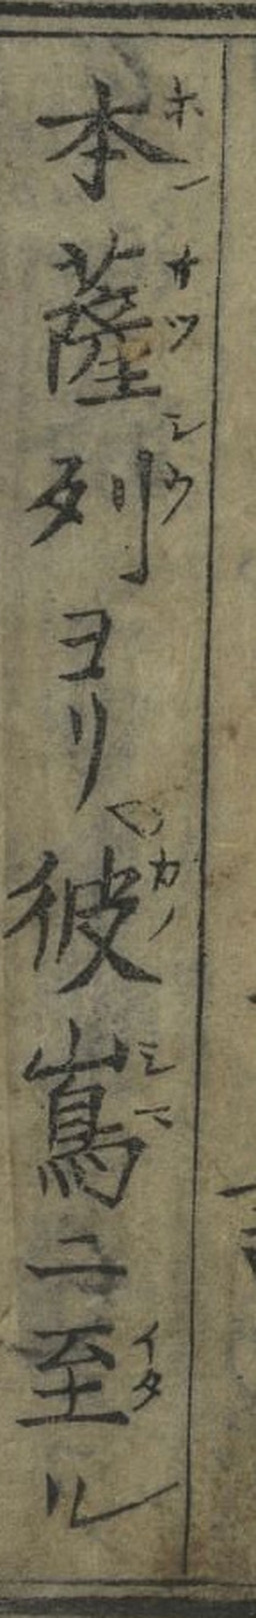本薩州ヨリ。彼島ニ至ル

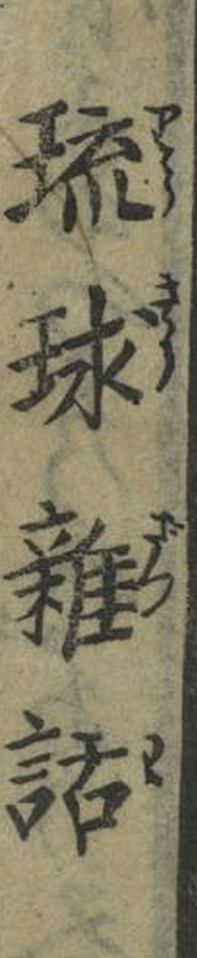琉球雑話
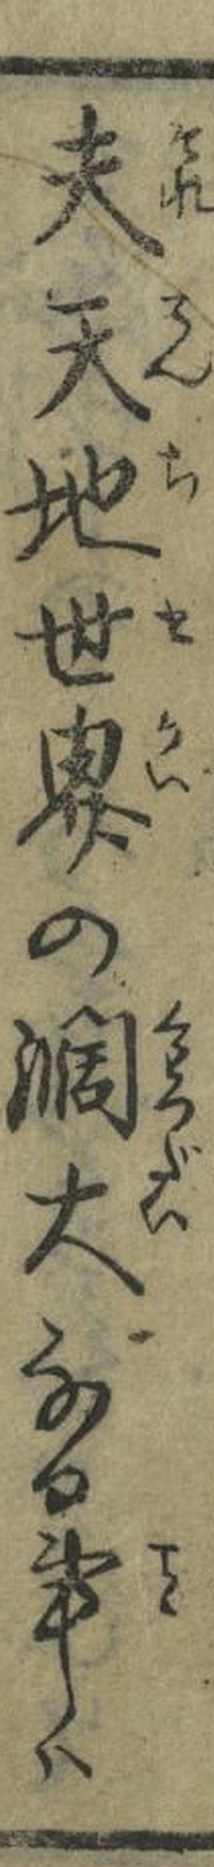夫天地世界の濶大なる事は
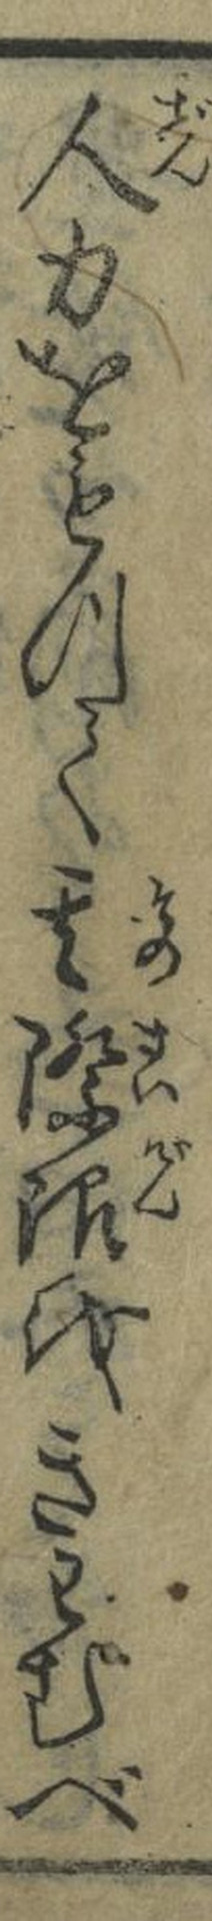人力をもつて其際限をきわむべ
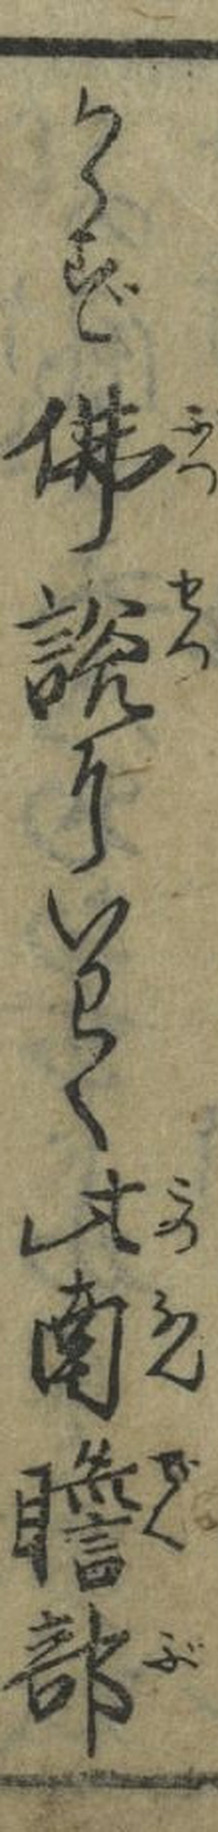からず仏説にいわく此南瞻部
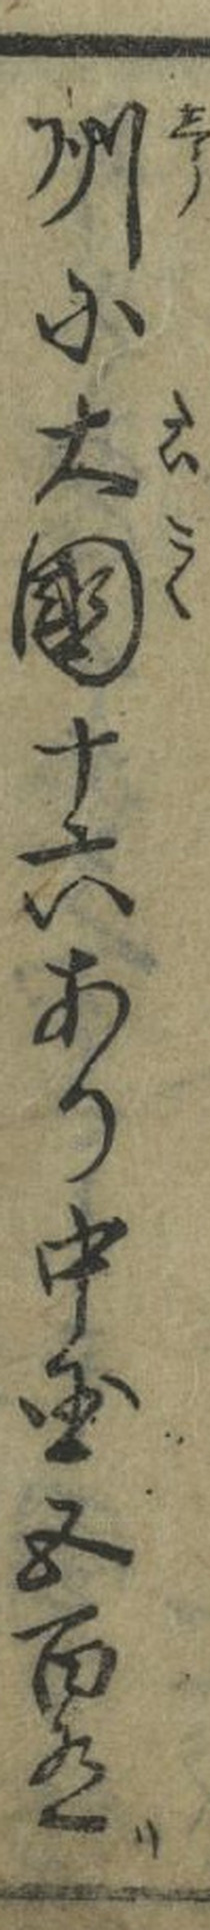州に大国十六あり中国五百有り
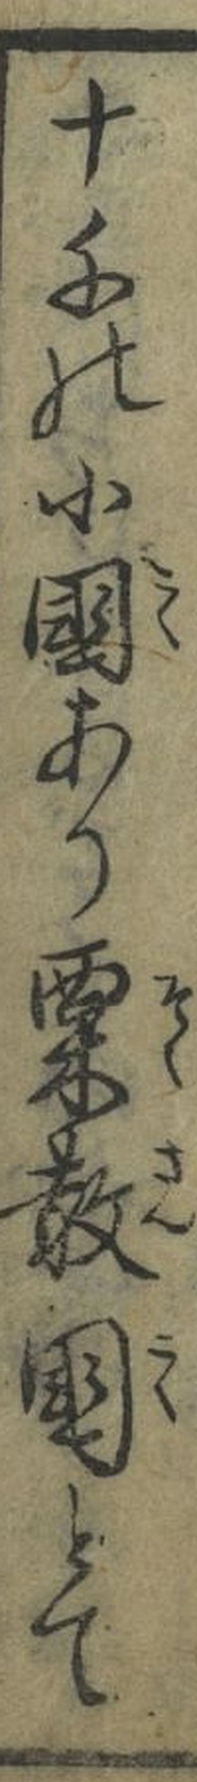十千の小国あり粟散国とて

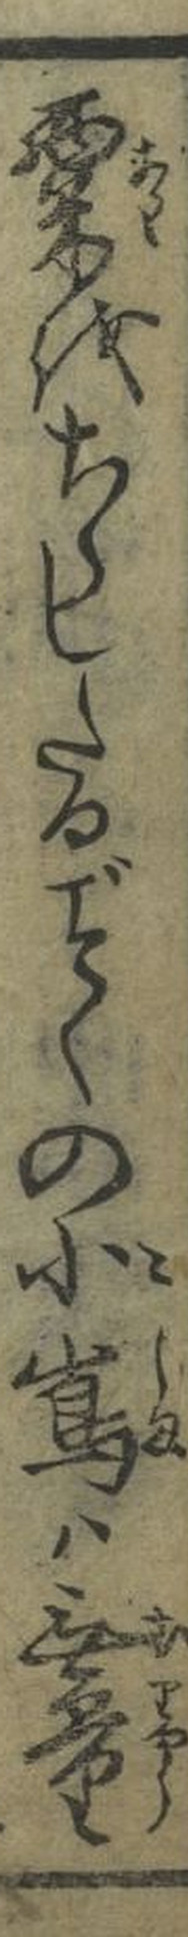粟をちらしたるごとくの小島は無量
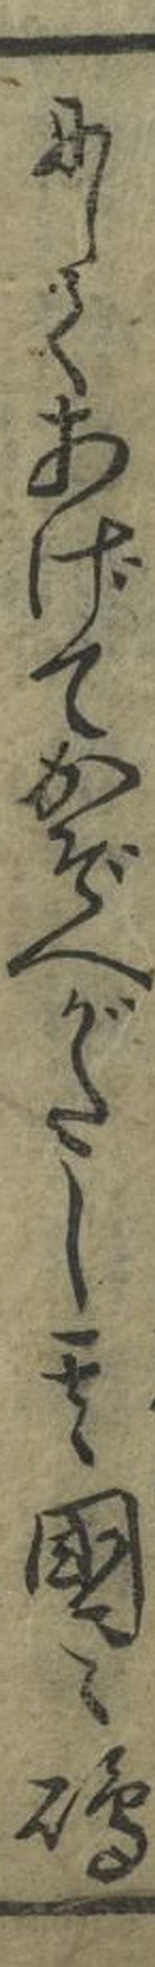にてあげてかぞへがたし其国々島
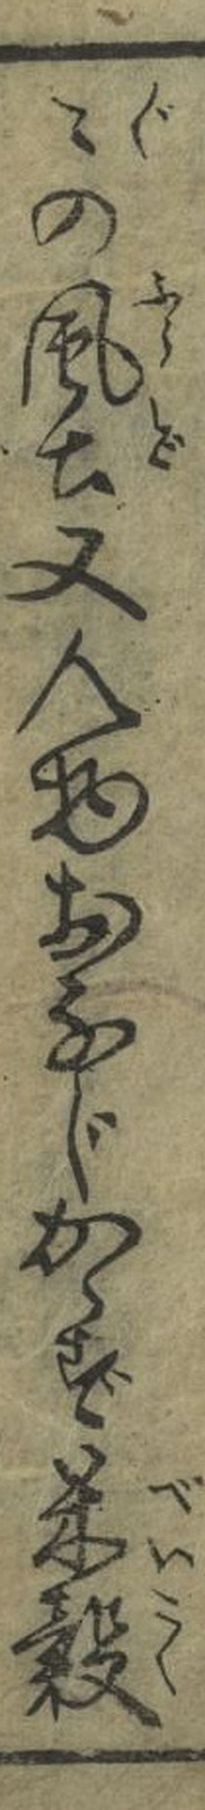々の風土又人物おなじからず米穀
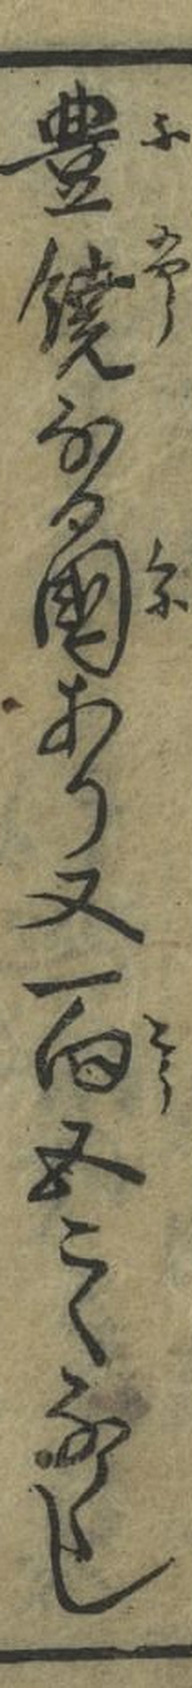豊饒なる国あり又一向五こくなくし
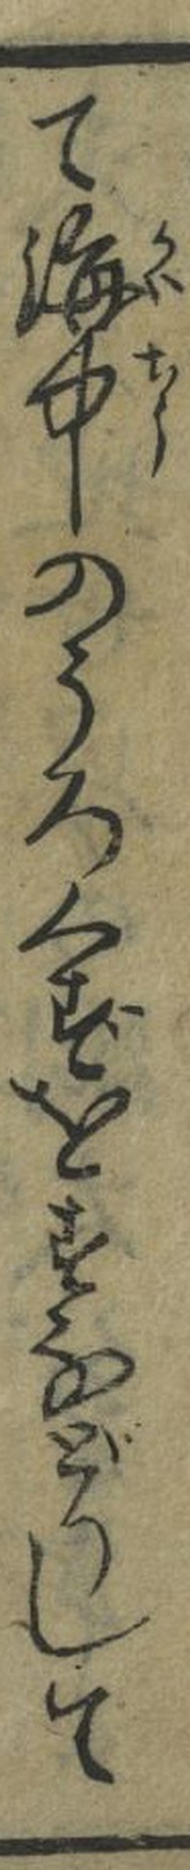て海中のうろくずをすなどりして
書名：琉球雑話
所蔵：University of the Ryukyus Library
